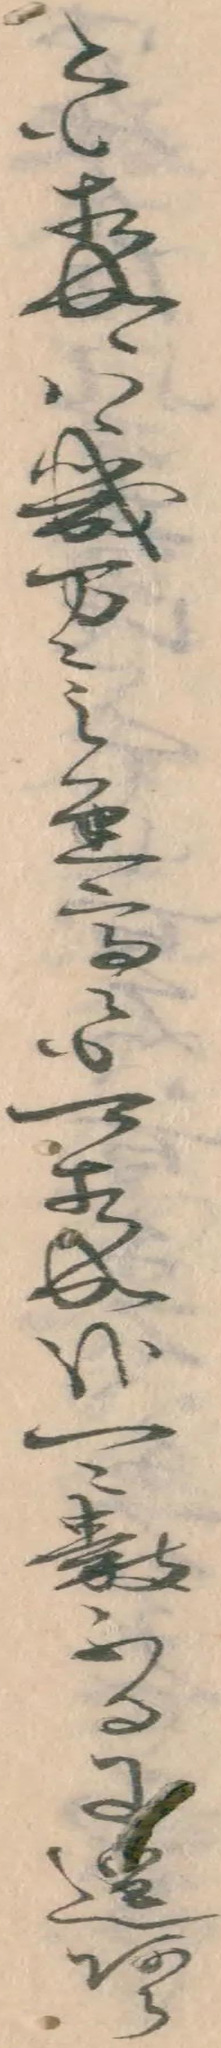とも相成候はゝ幾万々之金高にも可相成哉一々数ふるに遑あら
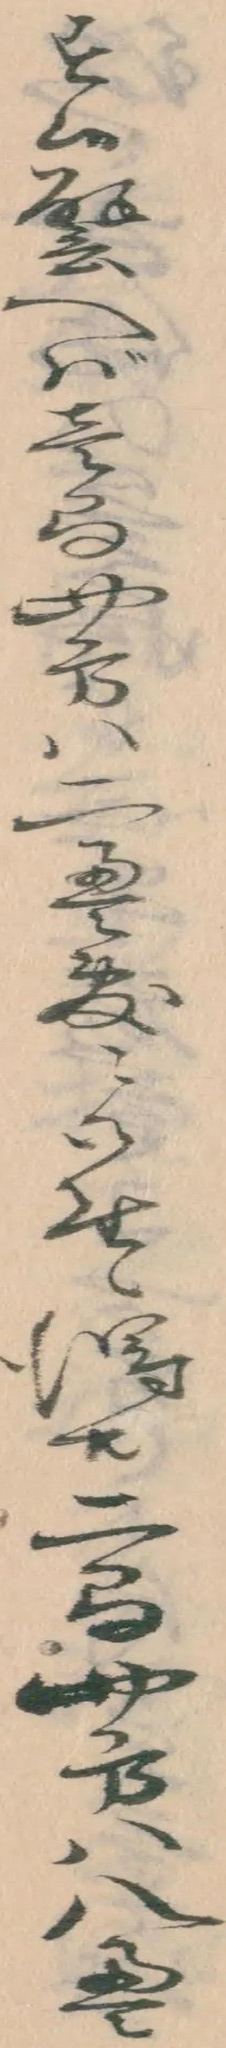す候譬へば壱間四方は二畳敷に御坐候得共二間四方は八畳
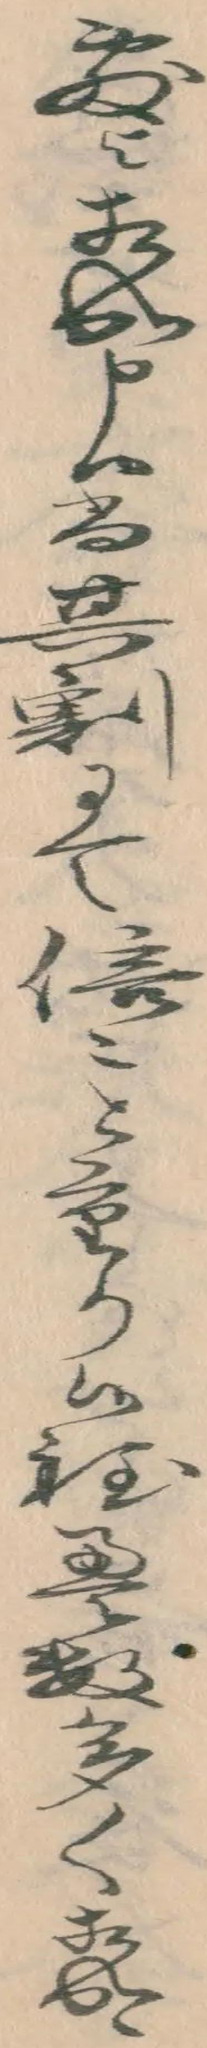敷と相成申候尚其割にて倍々と重り候程畳数多く相成候
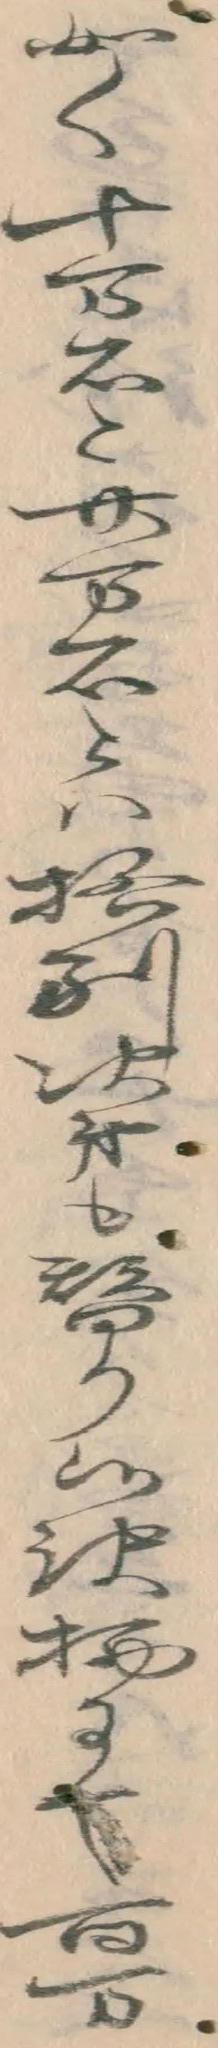如く十万石と廿万石とは格別次第も替り候訳柄にて百万
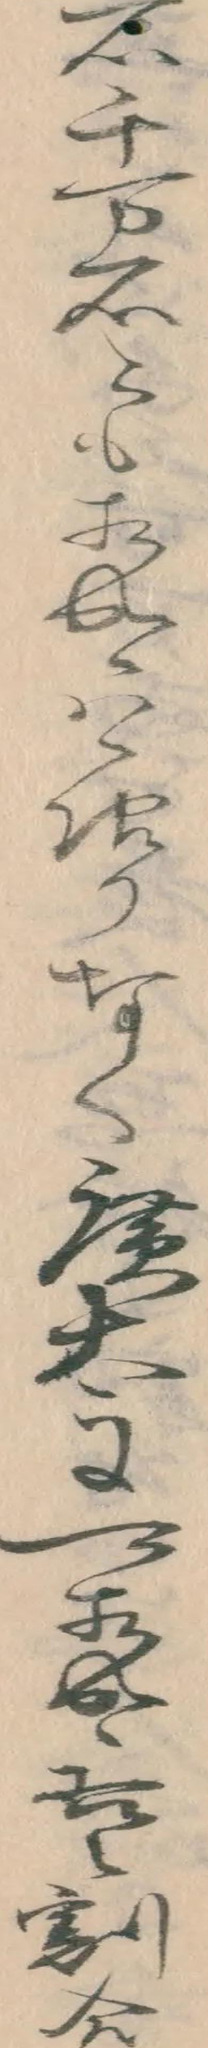石千万石とも相成候はゝ限りなく広太に可相成候右之割合
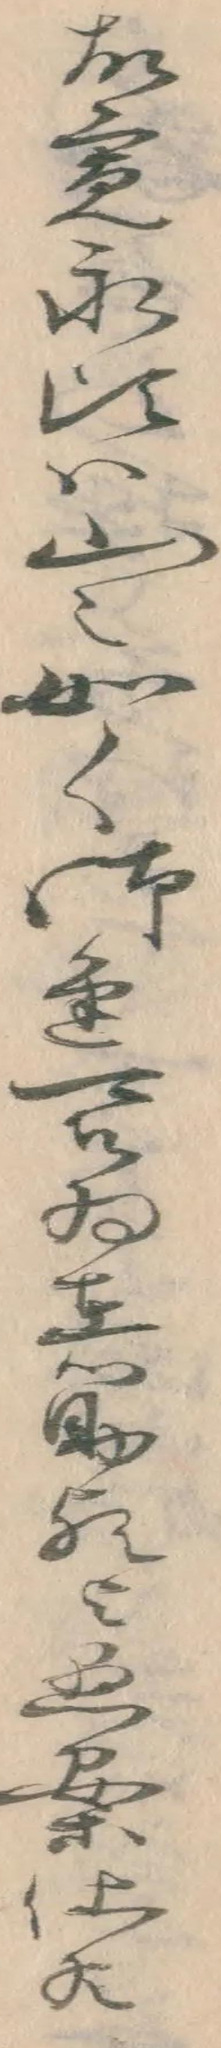故寛永頃は山之如く御金可被為在筋歟と愚案仕候
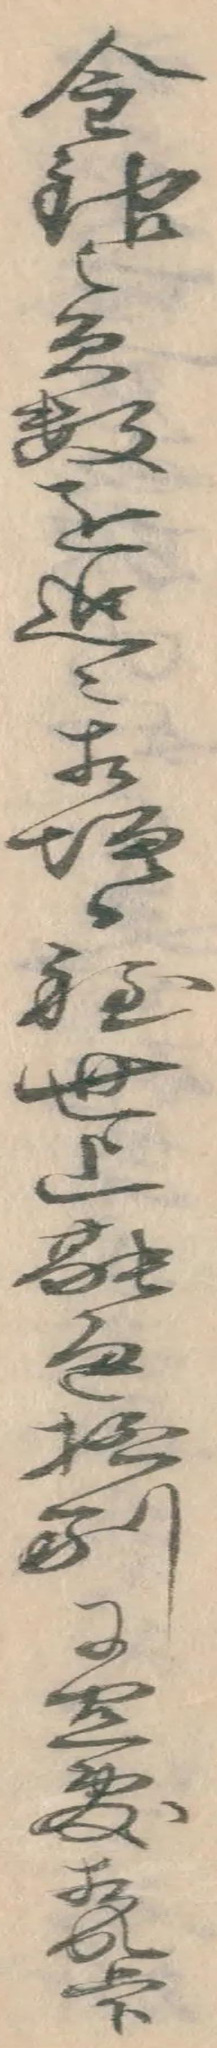一金銀之員数を追々相増候程世上融通格別に宜敷相成上下
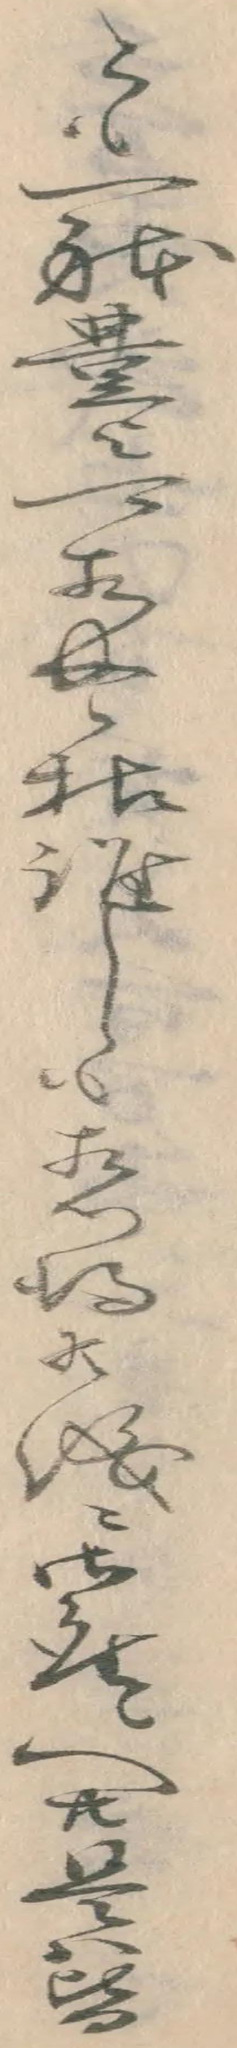とも一体豊と可相成候様誰しも相心得候儀に御座候へ共是は皆
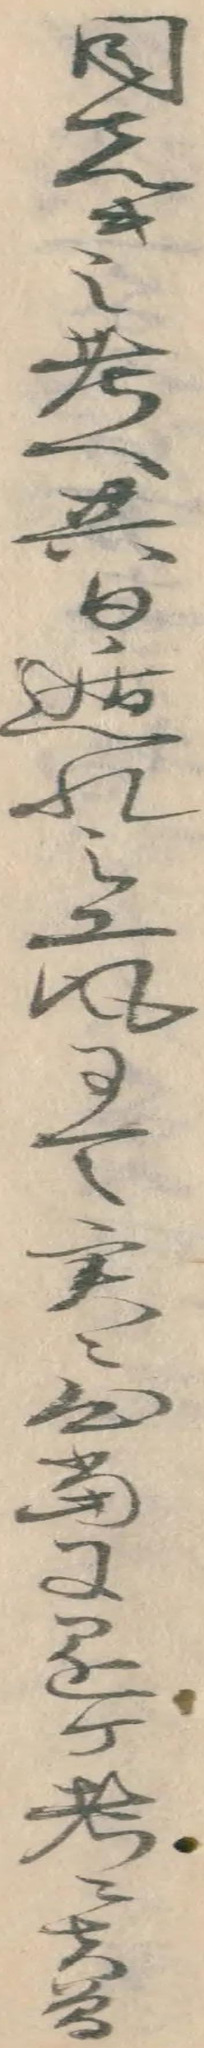目先き之考へ其日遁れ之工風にて実に心当に懸け考に者曽
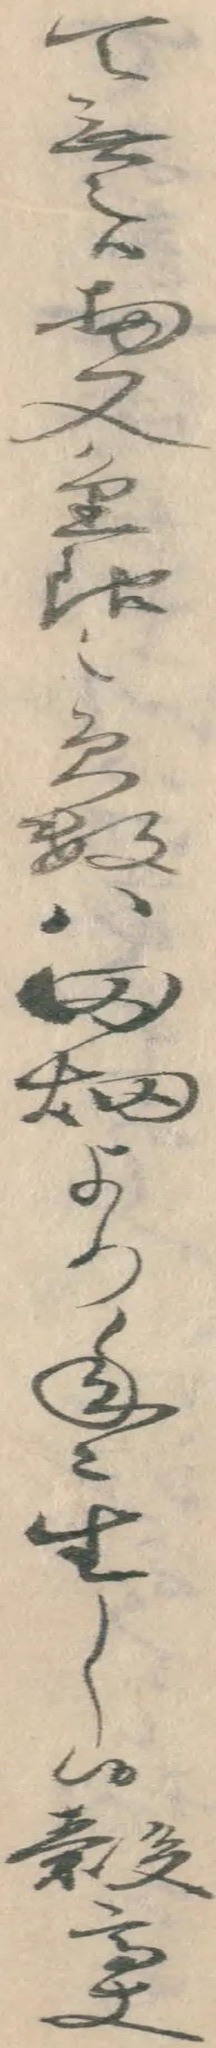て無之候扨又金銀之員数は田畑より年々生し候穀高丈
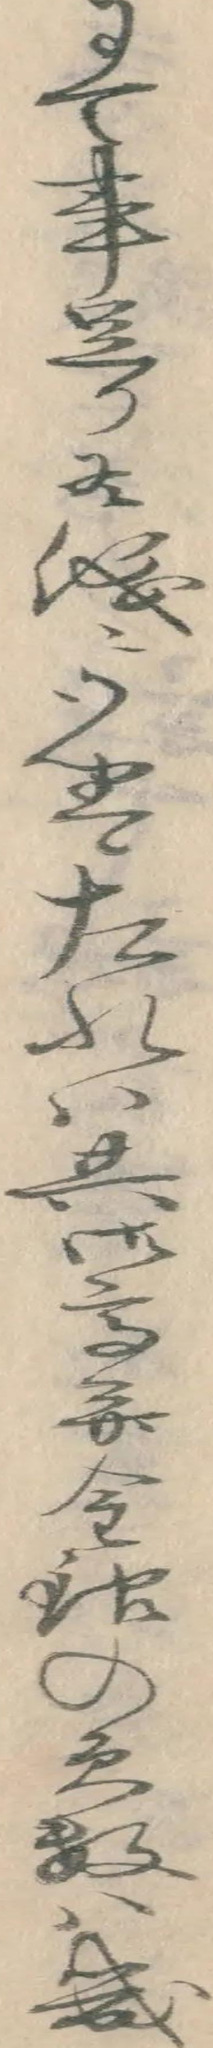にて事足り候儀に御坐候左れは其御高并金銀の員数は幾
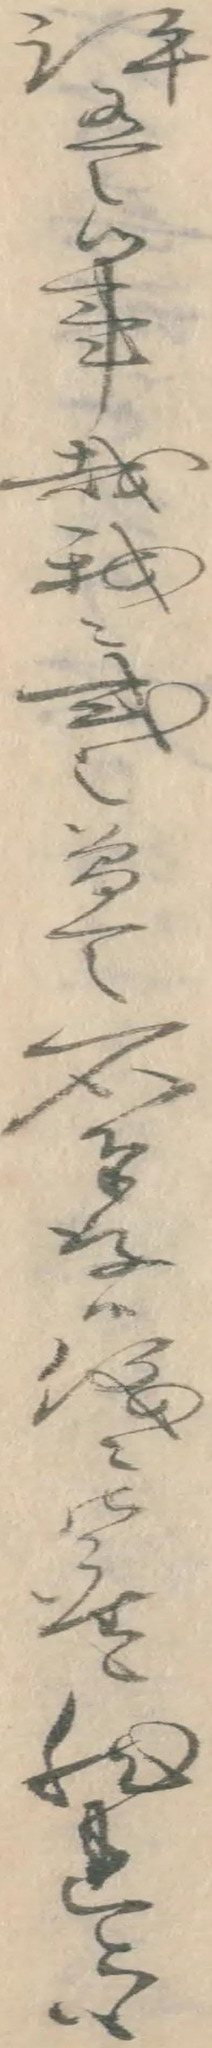許有之候事哉我々式之曽て不奉存候儀に御座候然れとも

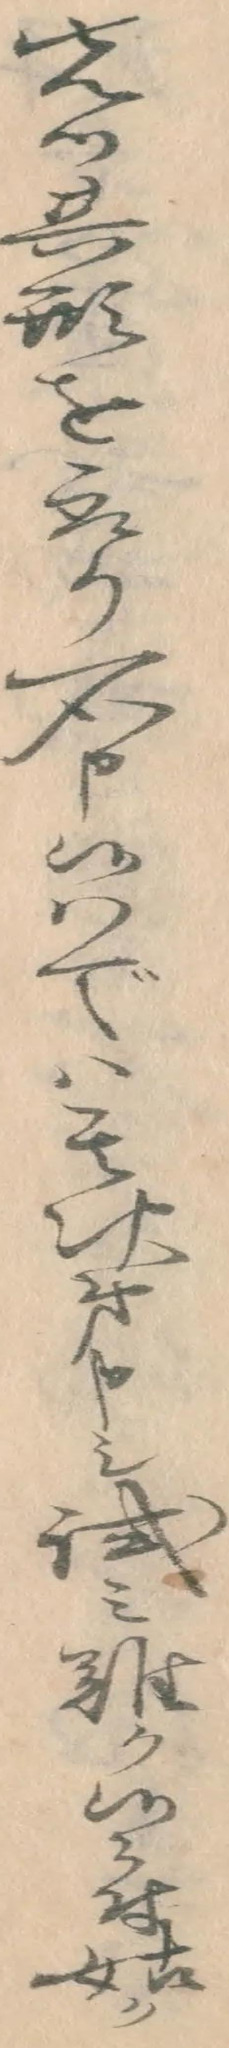先つ其形を取り不申候はでは其次第申し試み難く候に付姑く
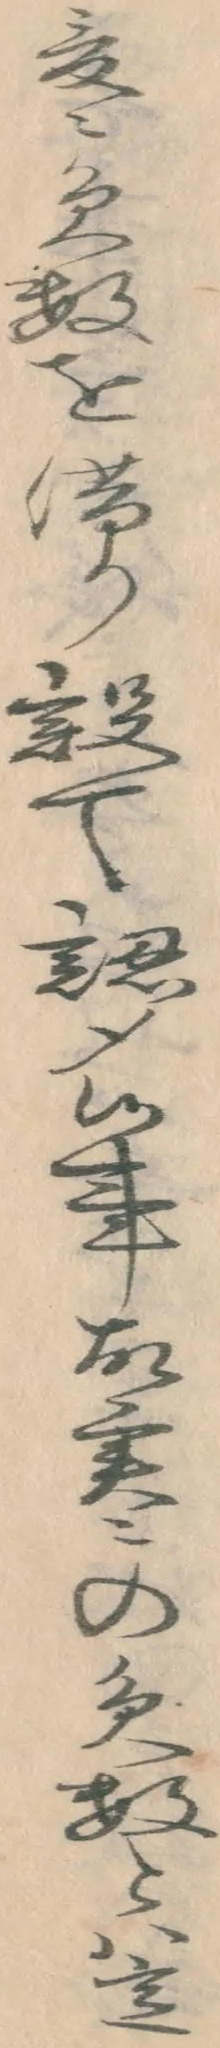爰に員数を借り設て認め候事故実々の員数とは定
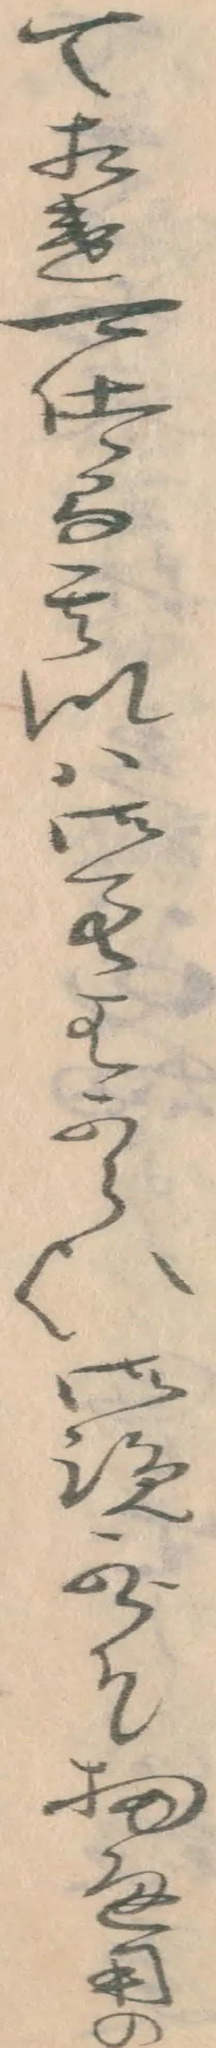て相違可仕候間其段は御差はからひ御覧可被下候扨通用の
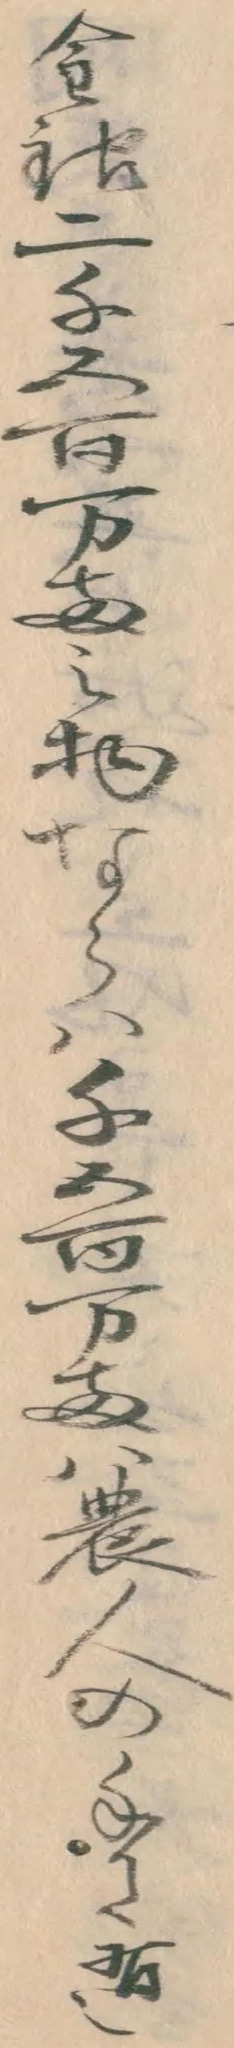金銀二千五百万両之物ならは千五百万両は農人の手に有之
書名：斎庭之穂
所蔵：国立国会図書館 National Diet Library, JAPAN
